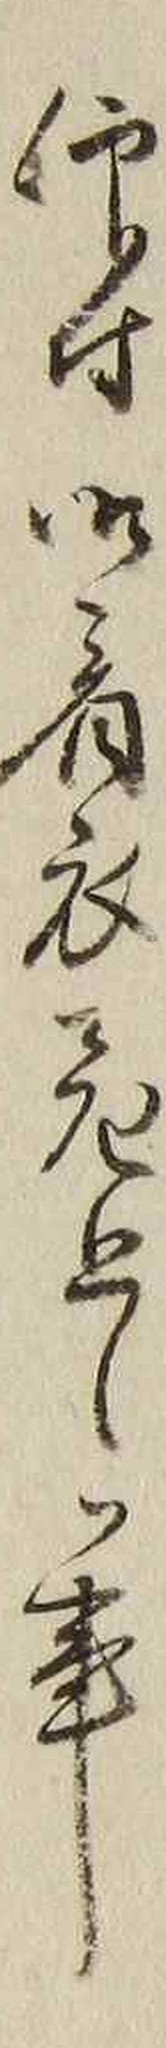仰付御肩衣差上候事
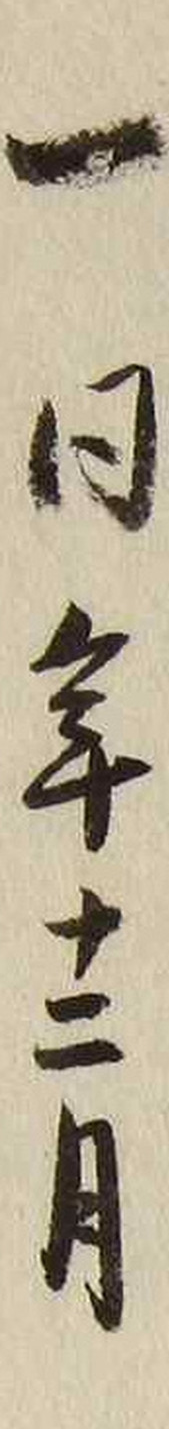一同年十二月
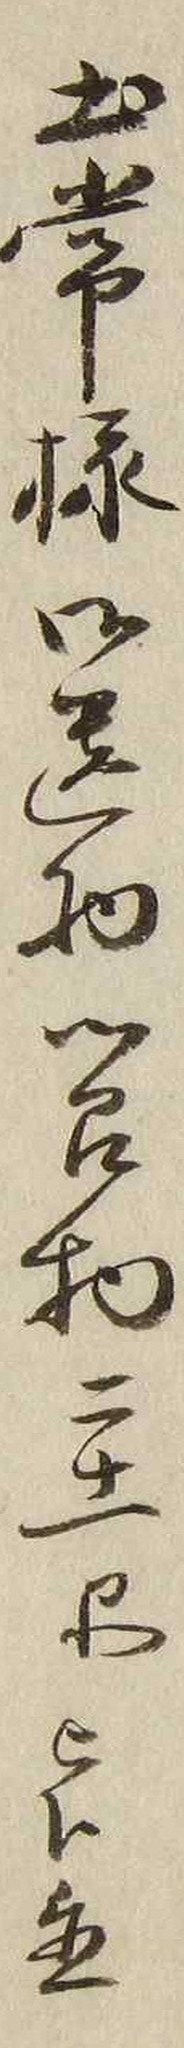土常様御遺物御召物二十一品被下置

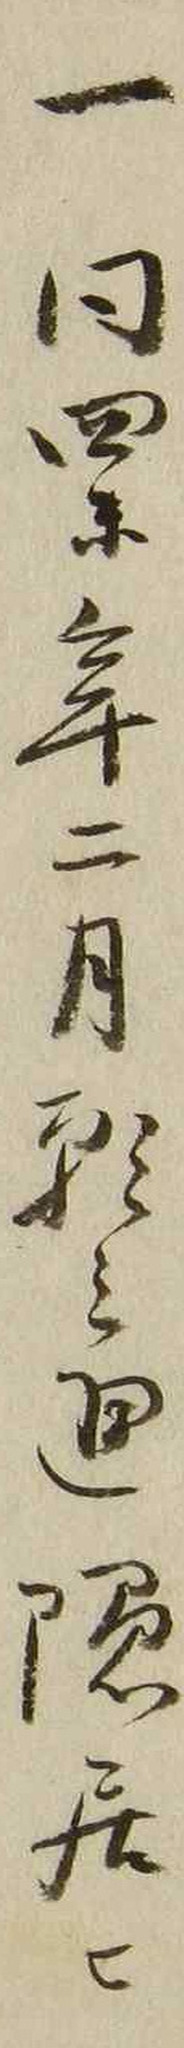一同四未年二月願之通隠居被
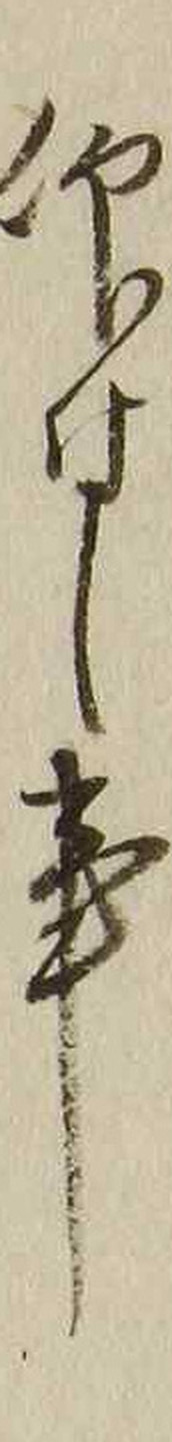仰付候事
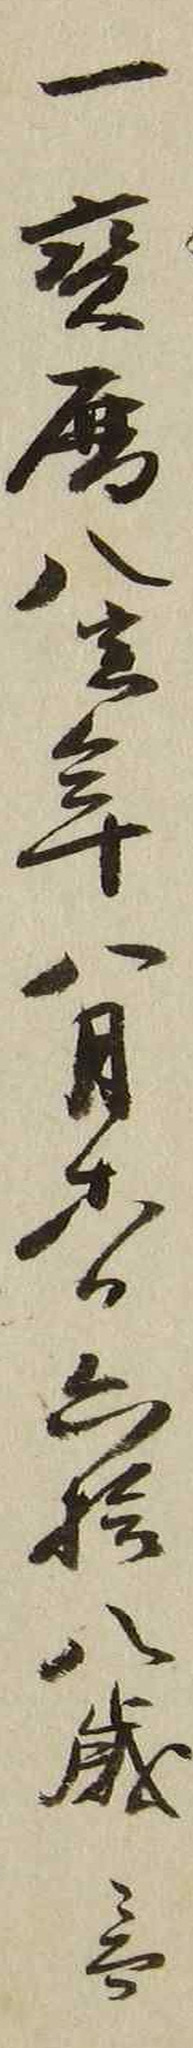一宝暦八寅年八月十八日六拾八歳に而
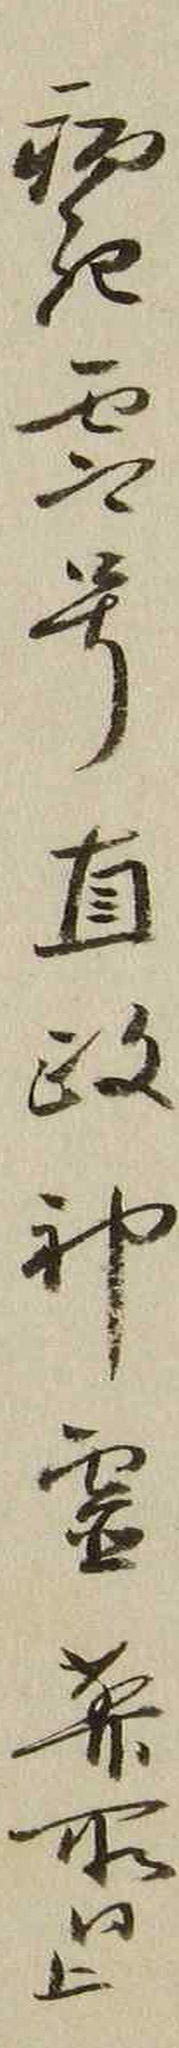病死霊号直政神霊葬所同上
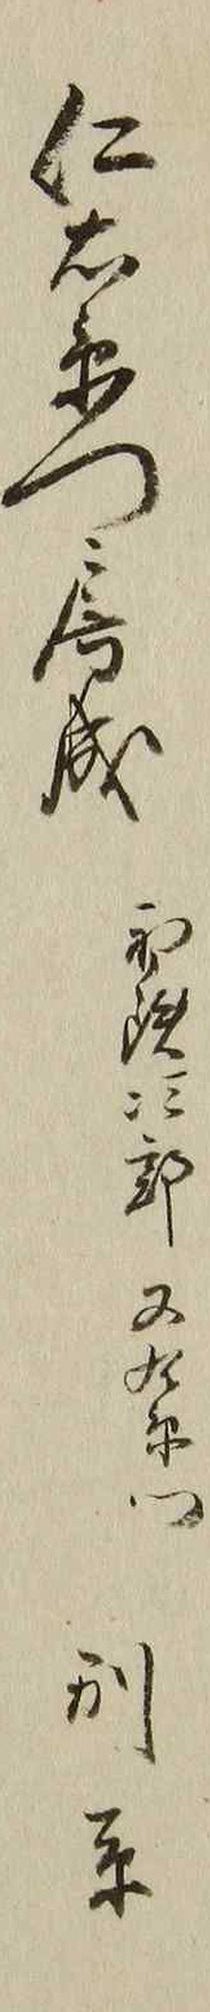仁右衛門房成初鉄次郎又右衛門別系
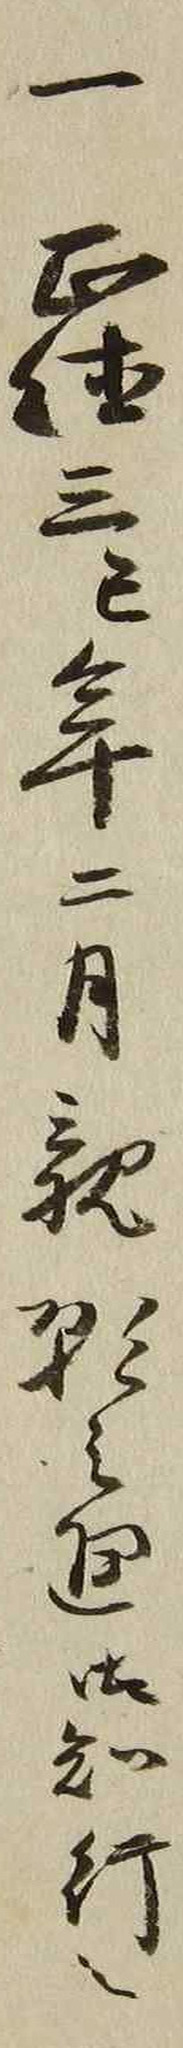一正徳三巳年二月親願之通御知行之
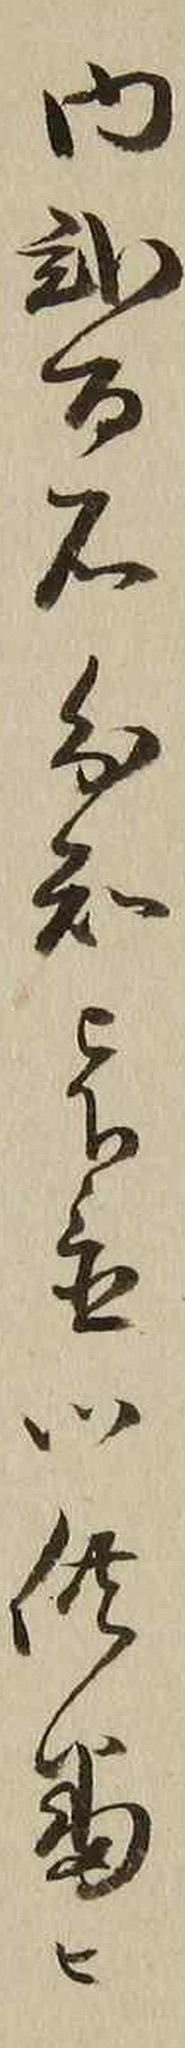内弐百石分知被下置御供番被
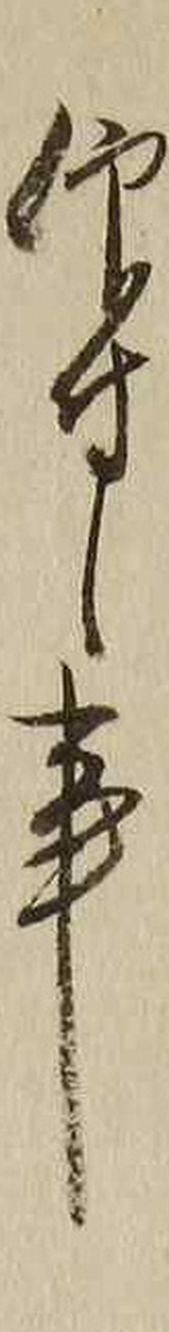仰付候事
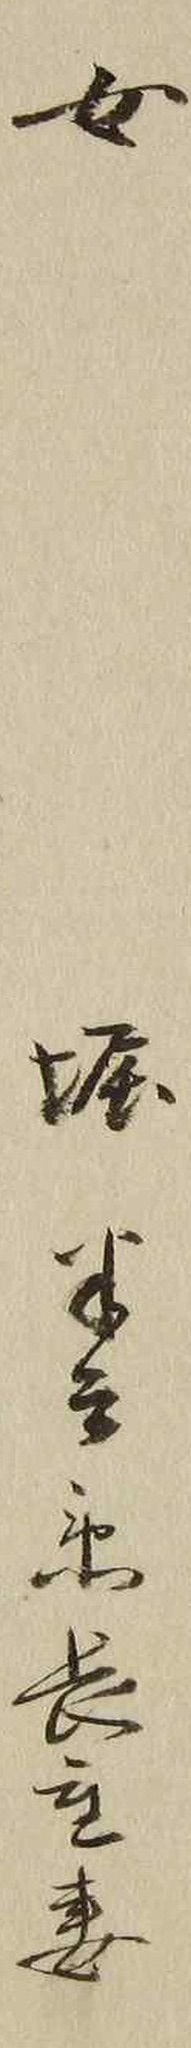女堀半兵衛長重妻
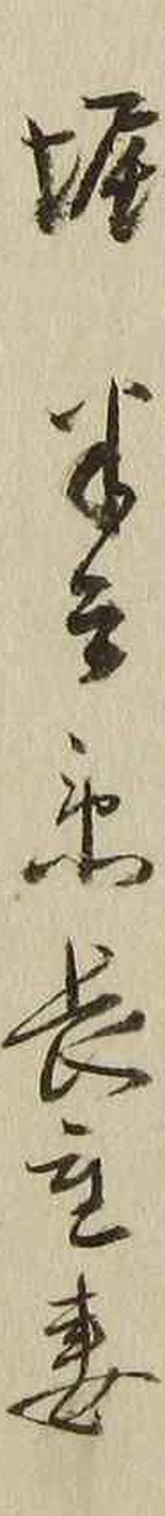女堀半兵衛長重妻
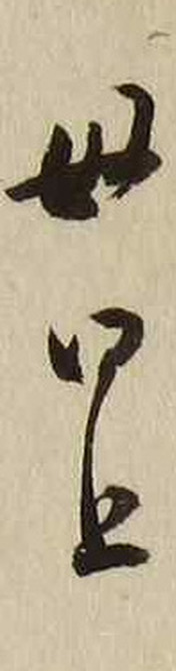母同上
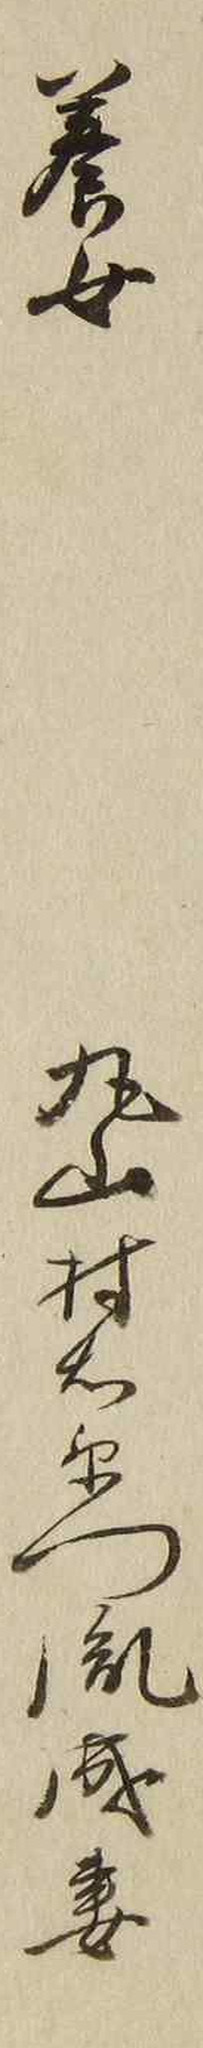養女丸山村右衛門胤茂妻

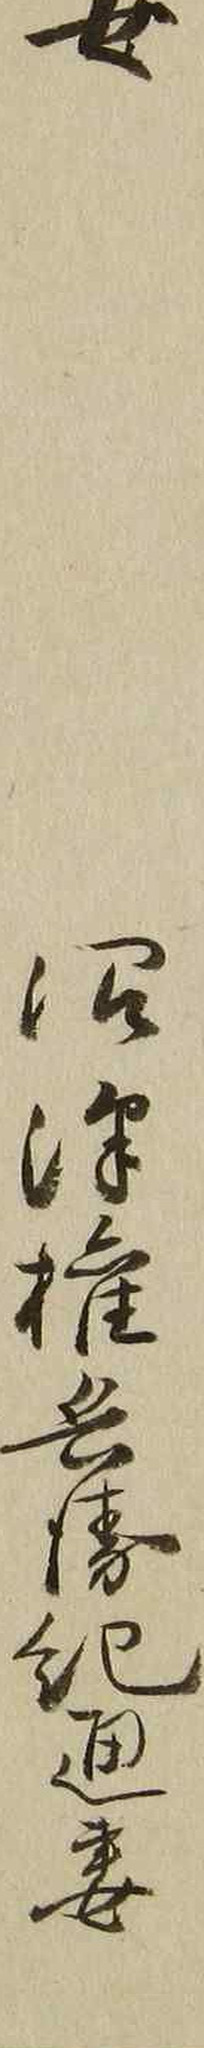女沼沢権兵衛紀通妻
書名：諸士系譜　巻之269　さ之部1
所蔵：会津若松市立会津図書館
